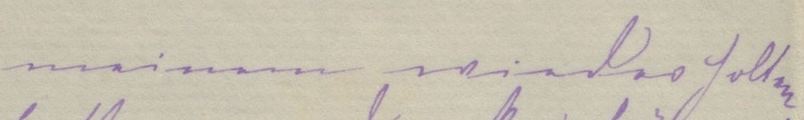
meinem wiederholten
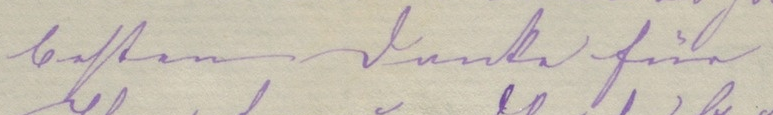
besten Danke für
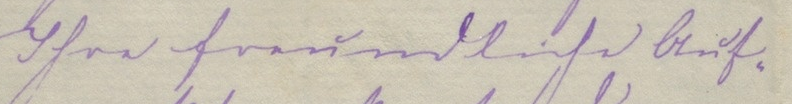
Ihre freundliche Auf-
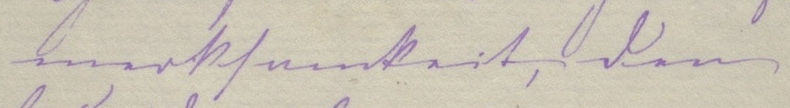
merksamkeit, den
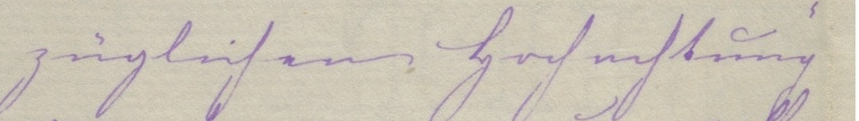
züglichen Hochachtung
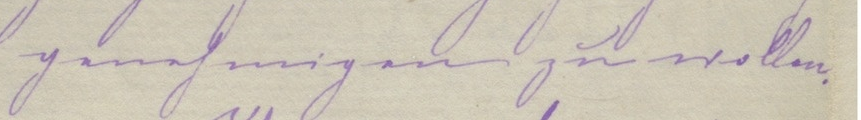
genehmigen zu wollen.
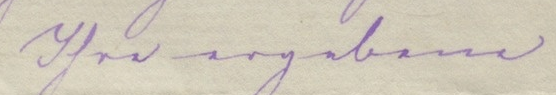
Ihre ergebene
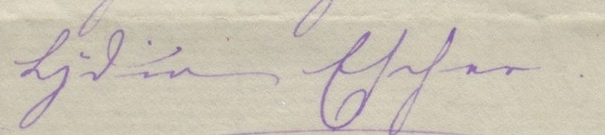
Lydia Escher.
